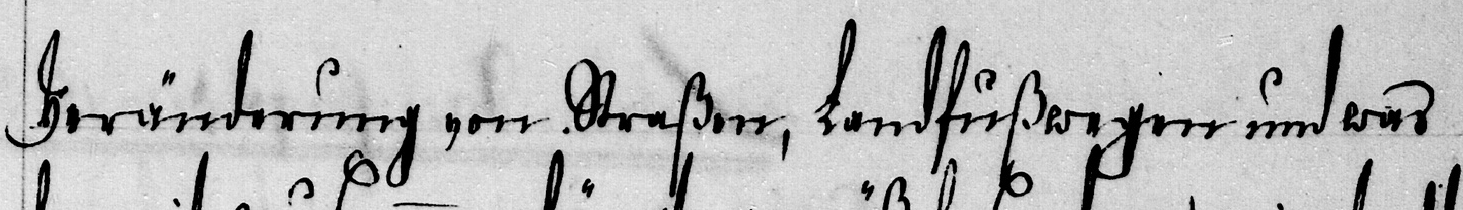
Veränderung von Straßen, Landfußwegen und was
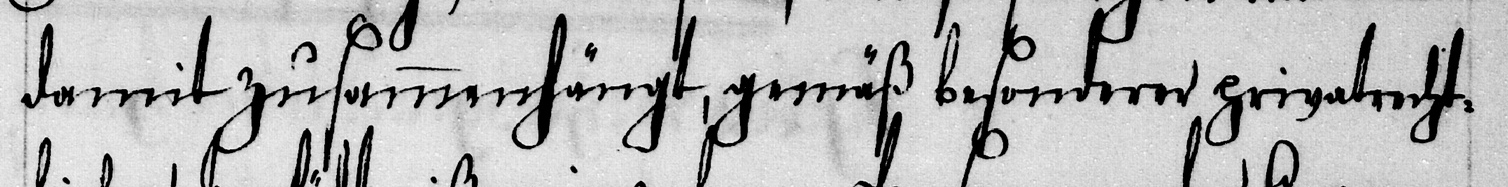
damit zusammenhängt, gemäß besonderer privatrecht¬
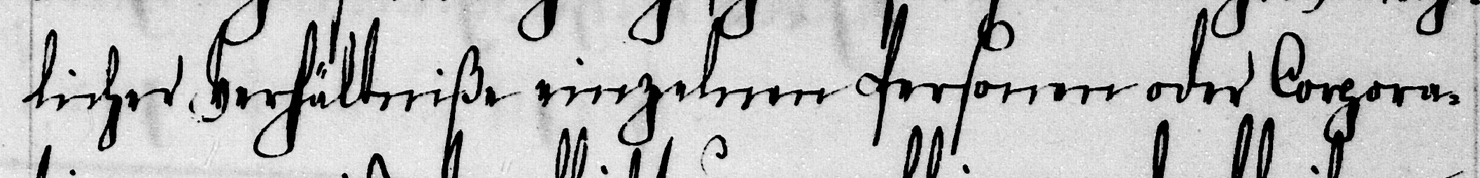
licher Verhältniße einzelnen Personen oder Corpora¬
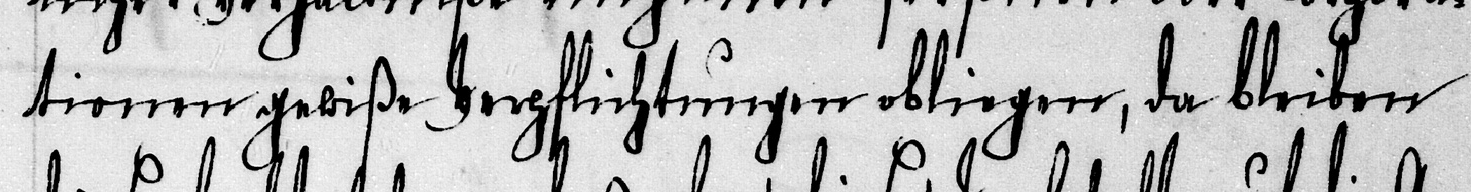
tionen gewiße Verpflichtungen obliegen, da bleiben
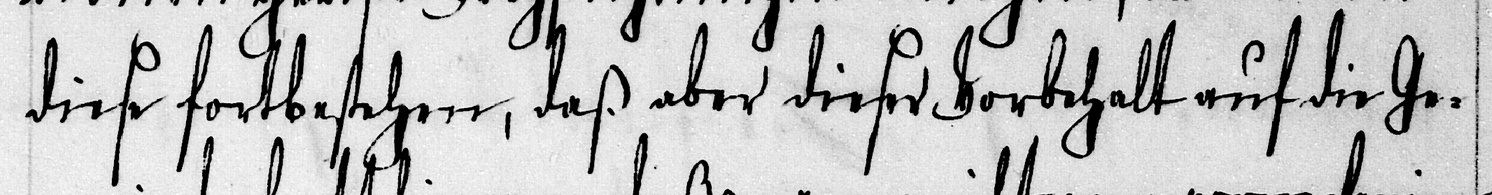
diese fortbestehen, daß aber dieser Vorbehalt auf die Ge¬
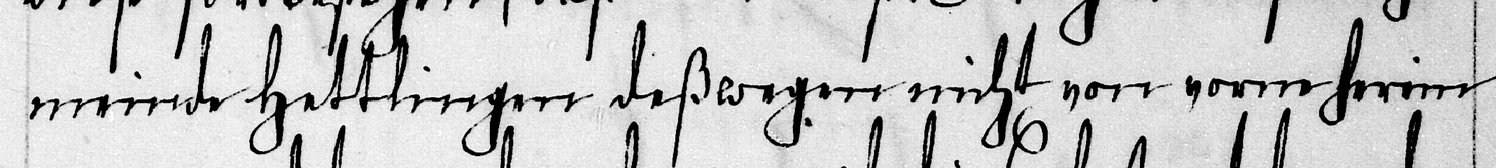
meinde Hettlingen deßwegen nicht von vorne herein
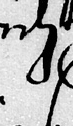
2.
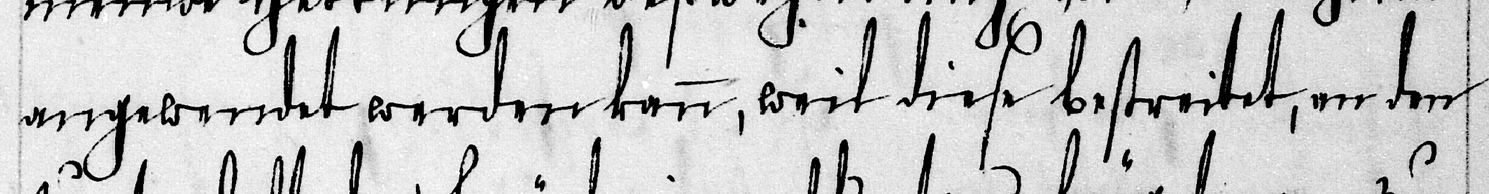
angewendet werden kann ,weil diese bestreitet, an den
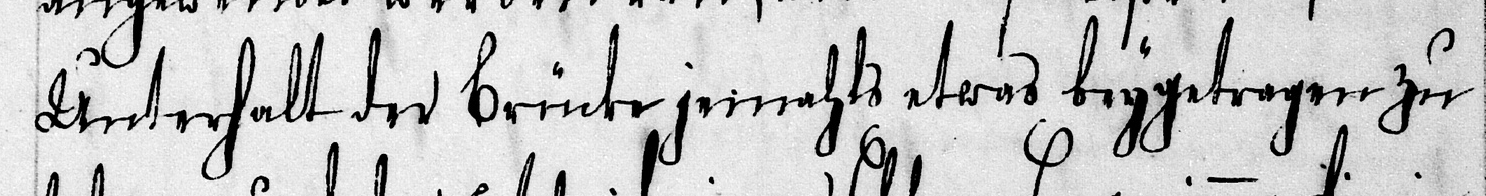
Unterhalt der Brücke jemahls etwas beygetragen zu
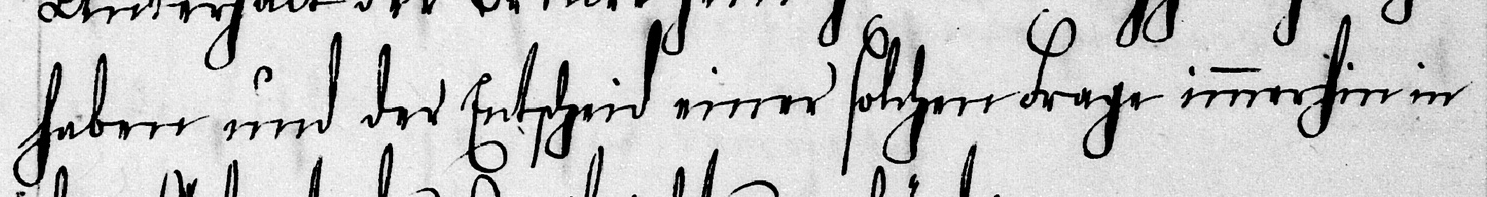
haben und der Entscheid einer solchen Frage immerhin in
